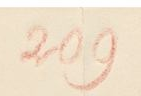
Präsident
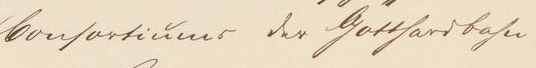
Consortiums der Gotthardbahn
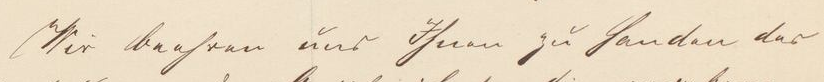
Wir beehren uns Ihnen zu Handen des
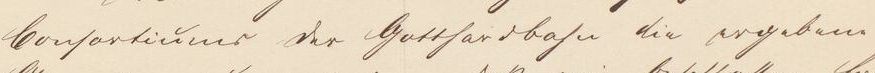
Consortiums der Gotthardbahn die ergebene
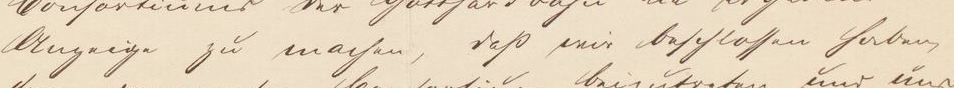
Anzeige zu machen, daß wir beschlossen haben,
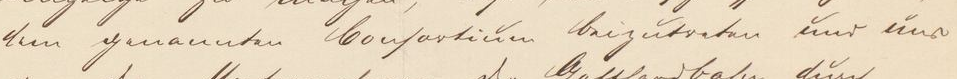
dem genannten Consortium beizutreten und uns
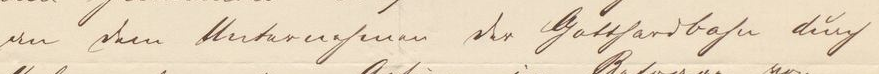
an dem Unternehmen der Gotthardbahn durch
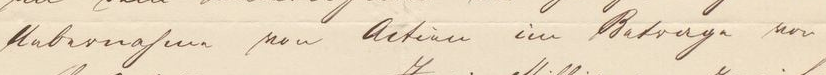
Uebernahme von Actien im Betrage von
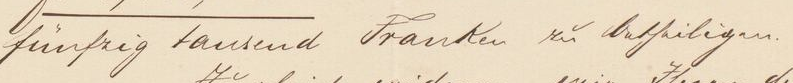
fünfzig tausend Franken zu betheiligen.
